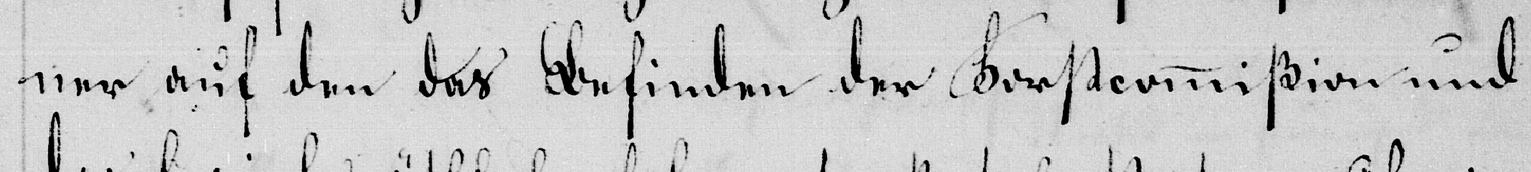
ner auf den das Befinden der Forstcommißion und
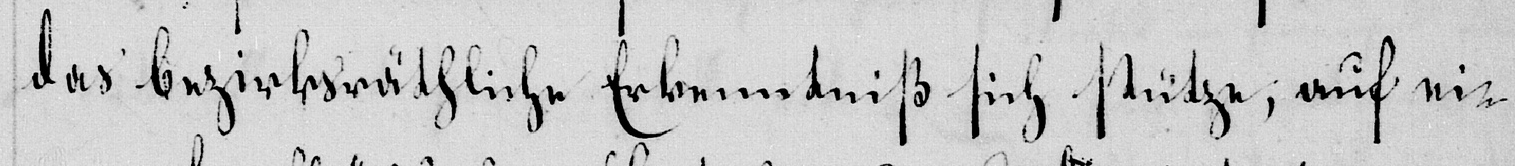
das bezirksräthliche Erkenntniß sich stütze; auf ei¬
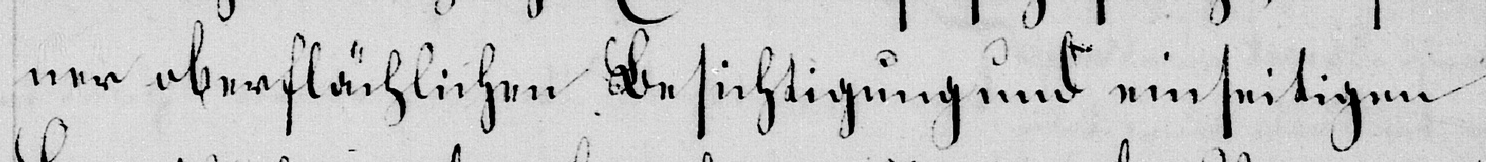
ner oberflächlichen Besichtigung und einseitigen
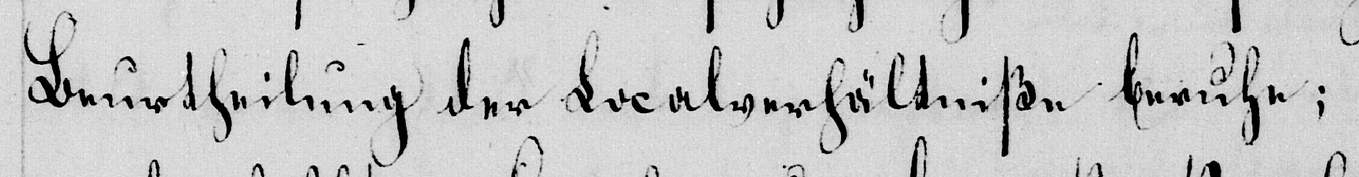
Beurtheilung der Localverhältniße beruhe;
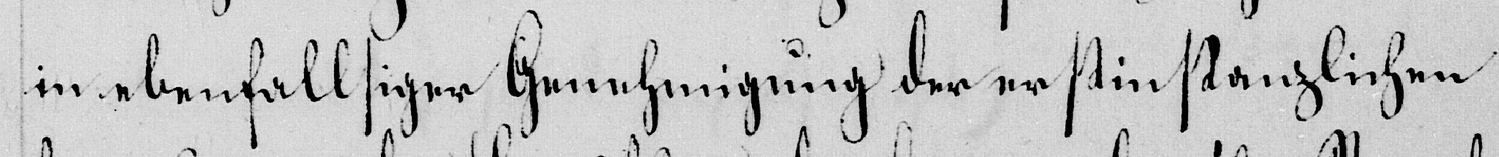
in ebenfallsiger Genehmigung der erstinstanzlichen
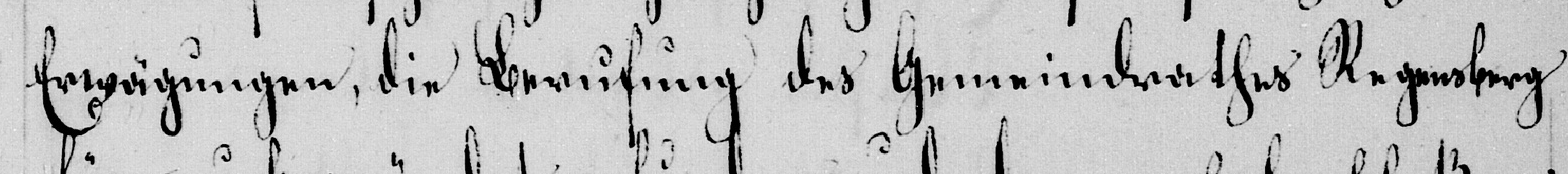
Erwägungen, die Berufung des Gemeindrathes Regensberg
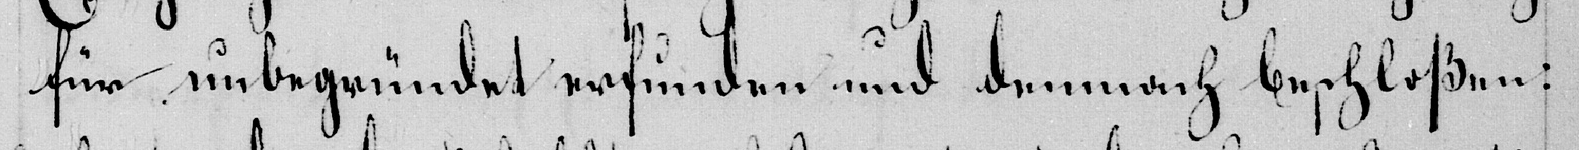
für unbegründet erfunden und demnach beschloßen:
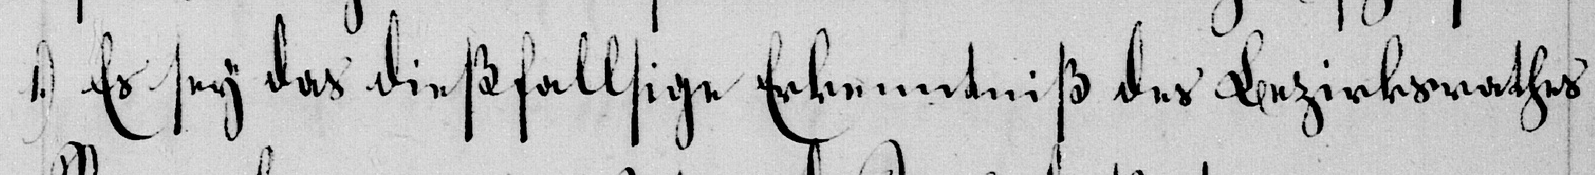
1.) Es sey das dießfällige Erkenntniß des Bezirksrathes
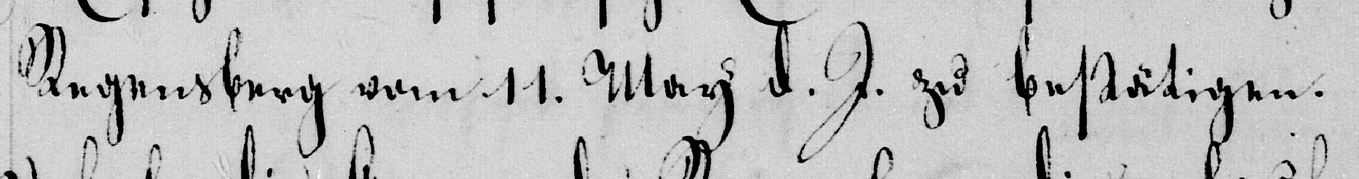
Regensberg vom 11. May d. J. zu bestätigen.
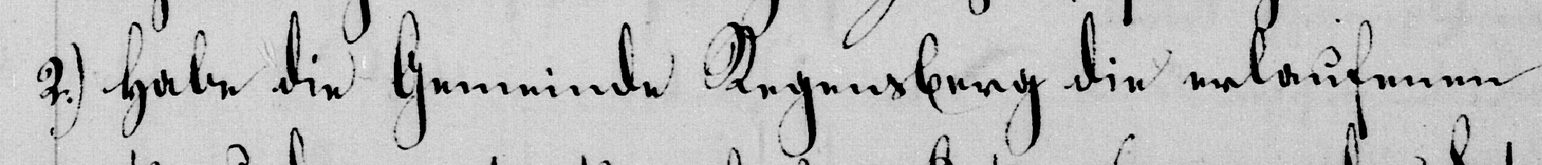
2.) Habe die Gemeinde Regensberg die erlaufenen
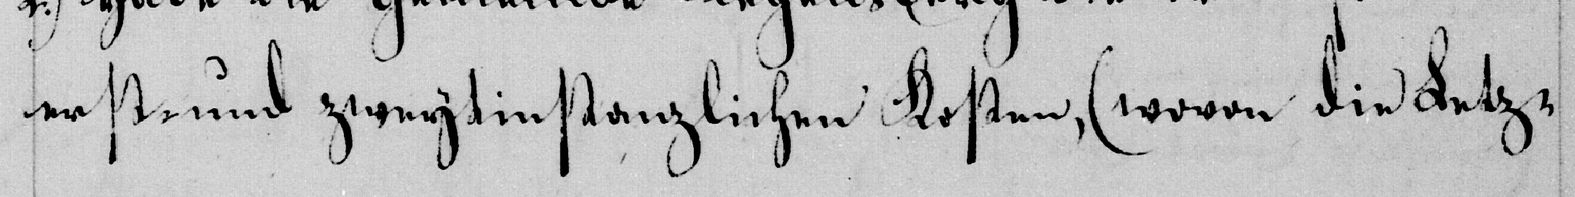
erst- und zweytinstanzlichen Kosten, (wovon die Letz-
